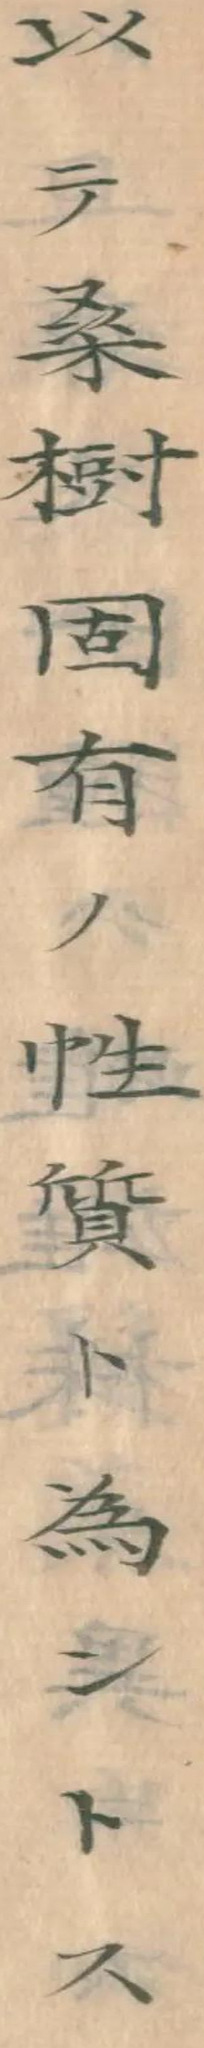以テ桑樹固有ノ性質ト為ントス
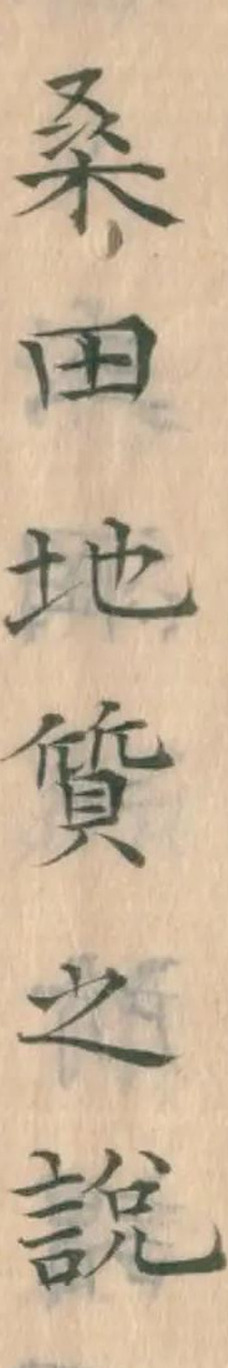桑田地質之説
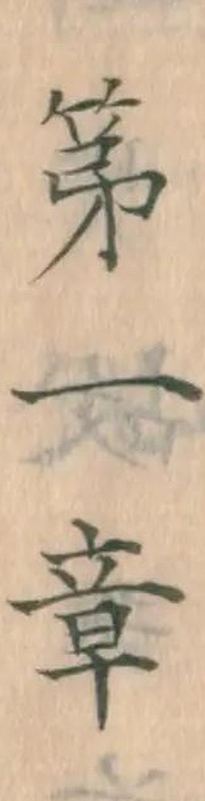第一章
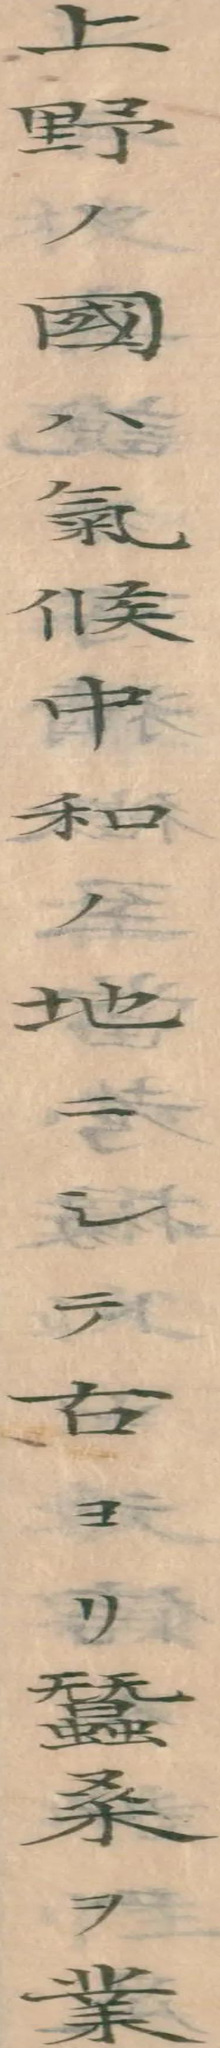上野ノ国ハ気候中和ノ地ニシテ古ヨリ蚕桑ヲ業
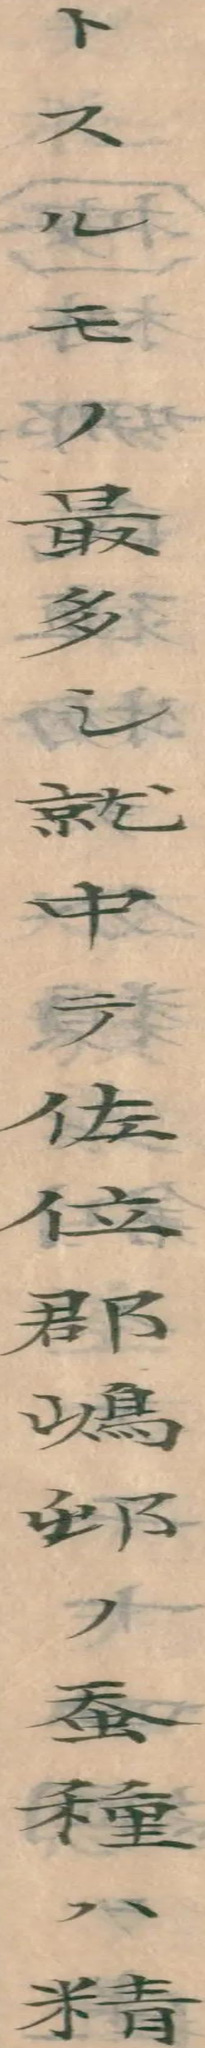トスルモノ最多シ就中テ佐位郡嶋邨ノ蚕種ハ精
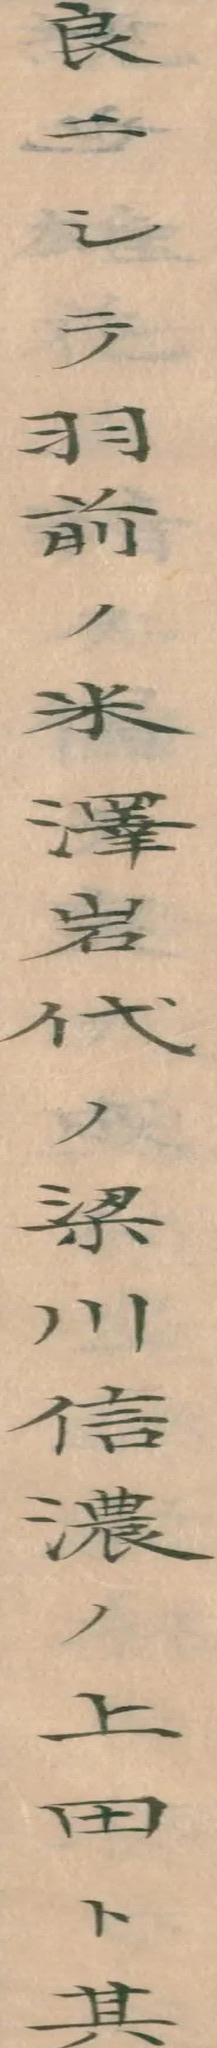良ニシテ羽前ノ米沢岩代ノ梁川信濃ノ上田ト其
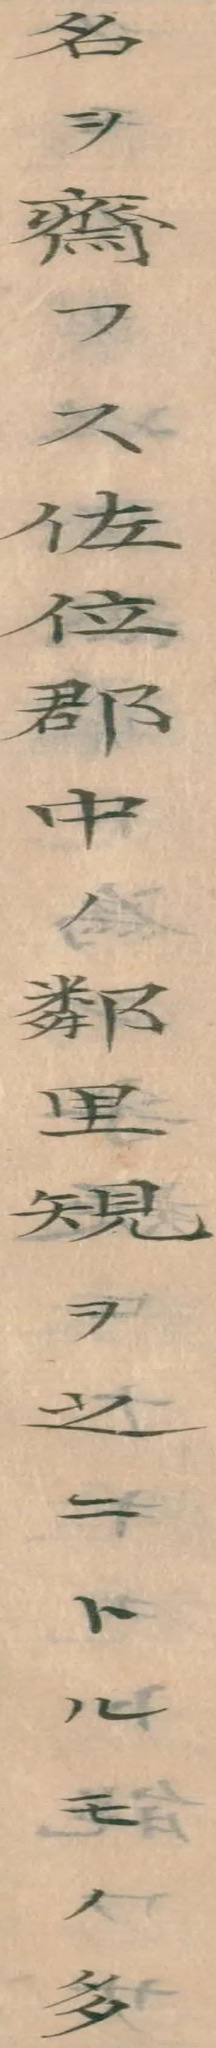名ヲ斎フス佐位郡中ノ鄰里䂓ヲ之ニトルモノ多
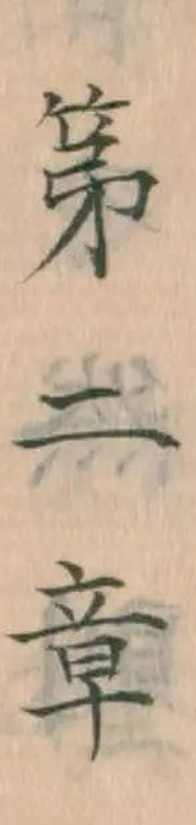第二章
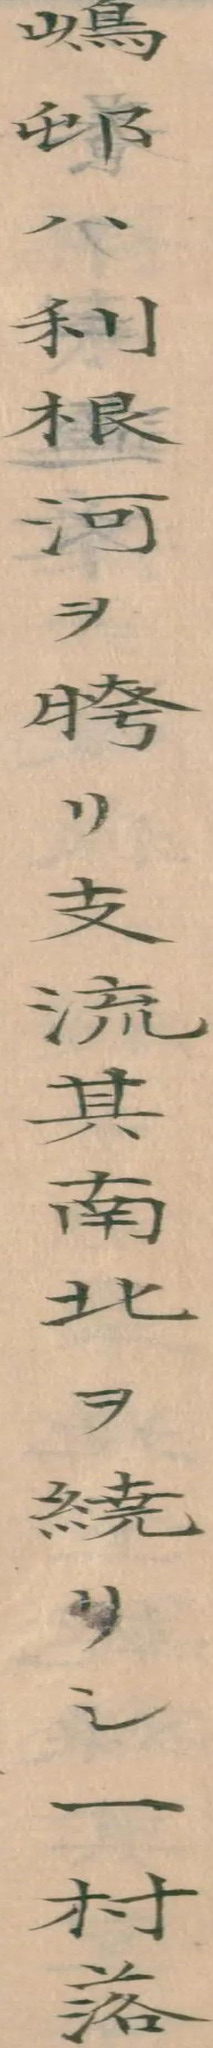嶋邨ハ利根河ヲ跨リ支流其南北ヲ繞リシ一村落
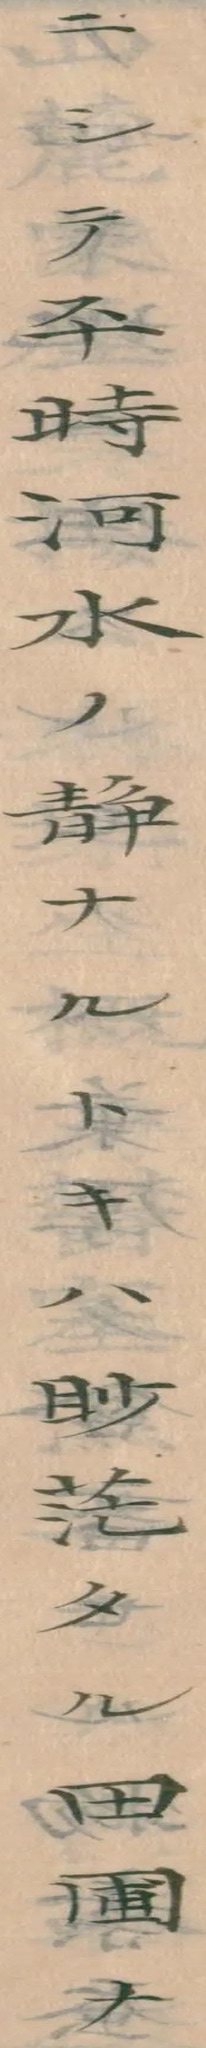ニシテ平時河水ノ静ナルトキハ眇茫タル田圃ナ
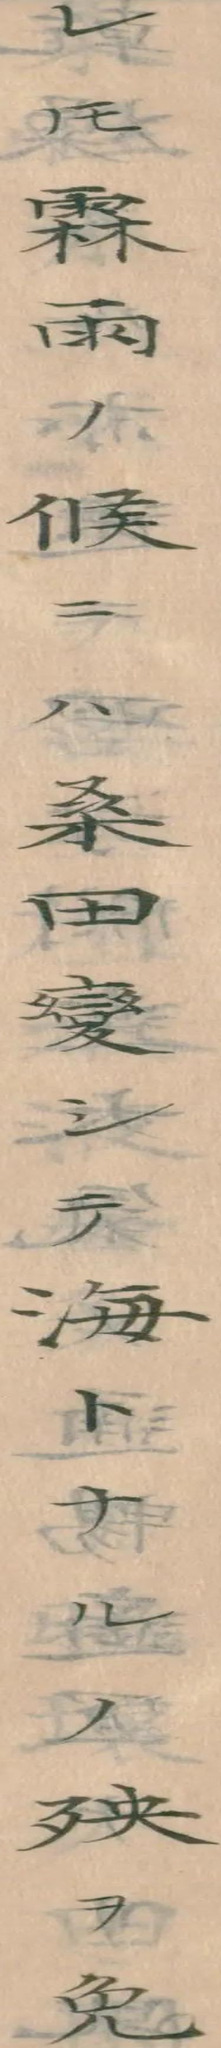レトモ霖雨ノ候ニハ桑田変シテ海トナルノ殃ヲ免
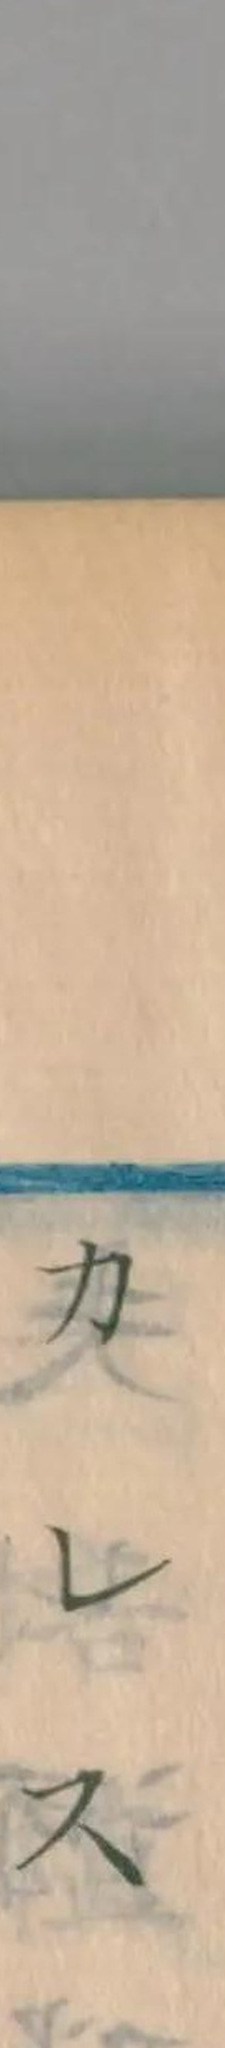カレス
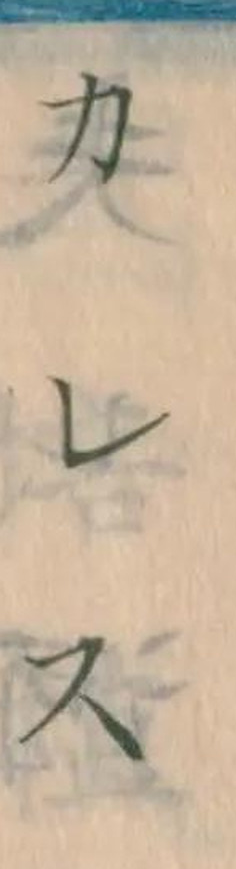カレス
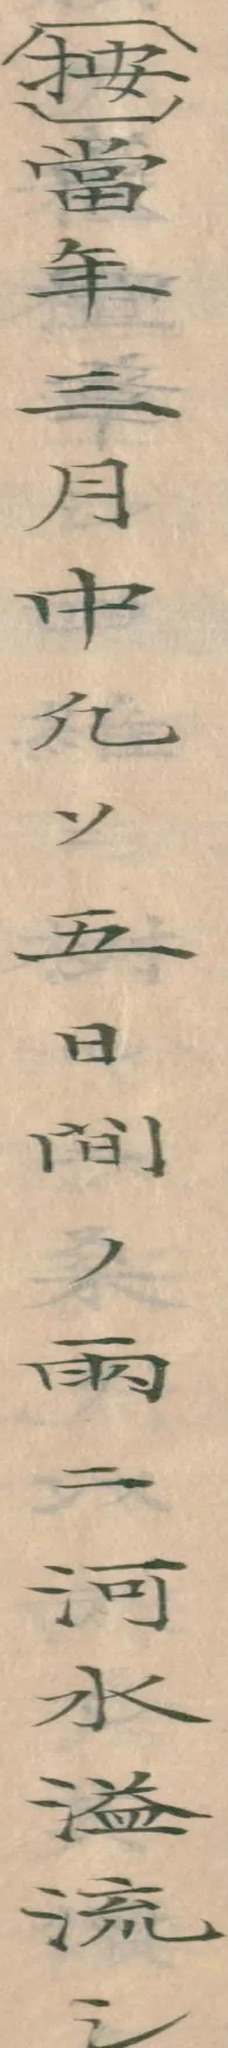[按]当年三月中凡ソ五日間ノ雨ニ河水溢流シ
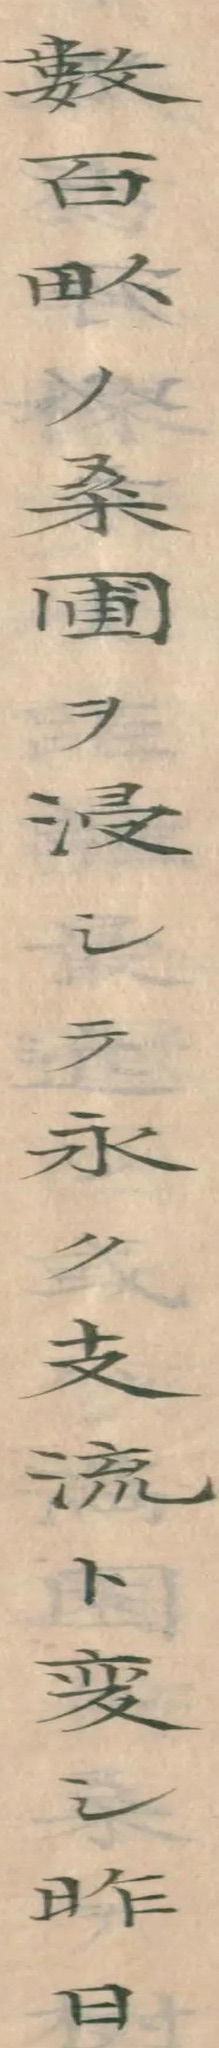数百㽗ノ桑圃ヲ浸シテ永ク支流ト変シ昨日
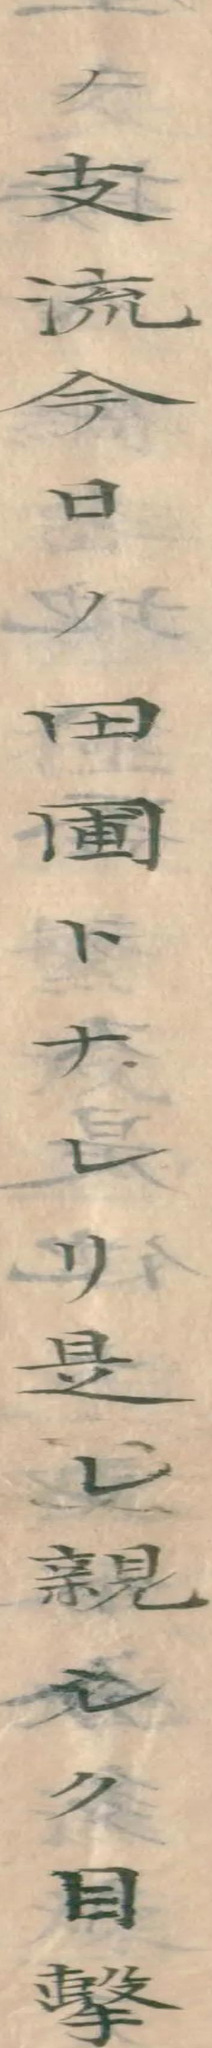ノ支流今日ノ田圃トナレリ是レ親シク目撃
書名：蚕桑集成
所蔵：国立国会図書館 National Diet Library, JAPAN
